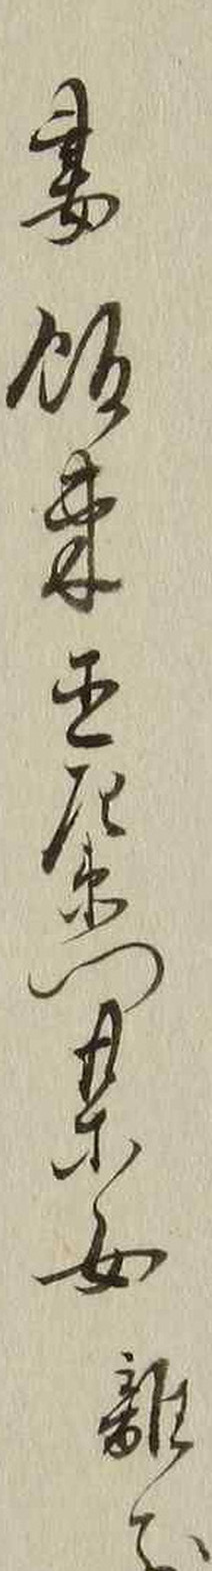妻飯束直左衛門某女離別
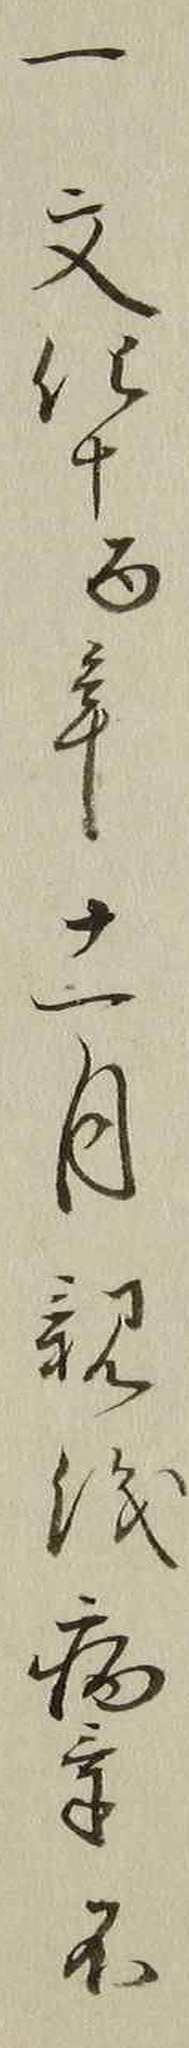一文化十酉年十一月親儀病気不
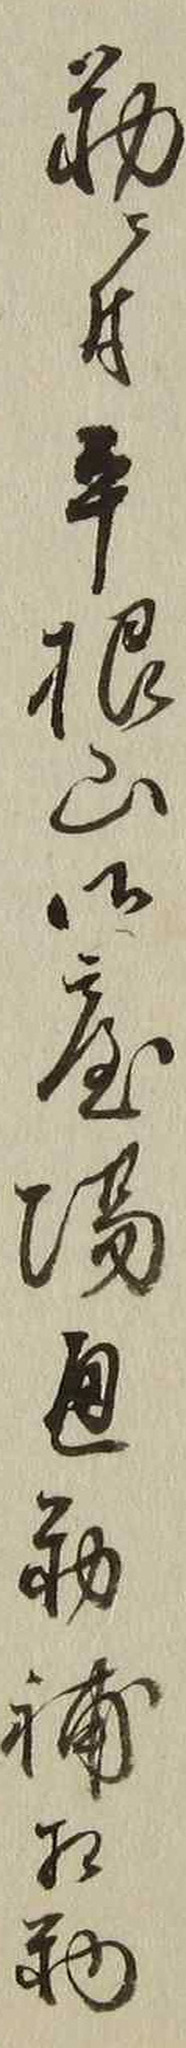勤ニ付平根山御産場通勤補相勤
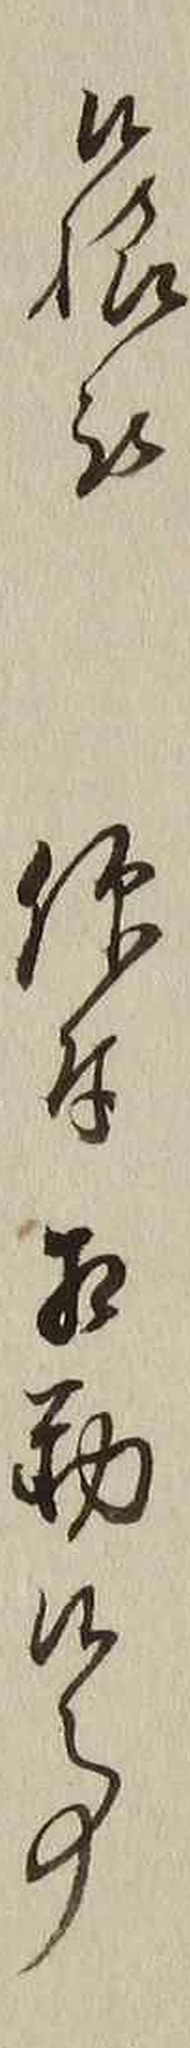候様被仰付相勤候事
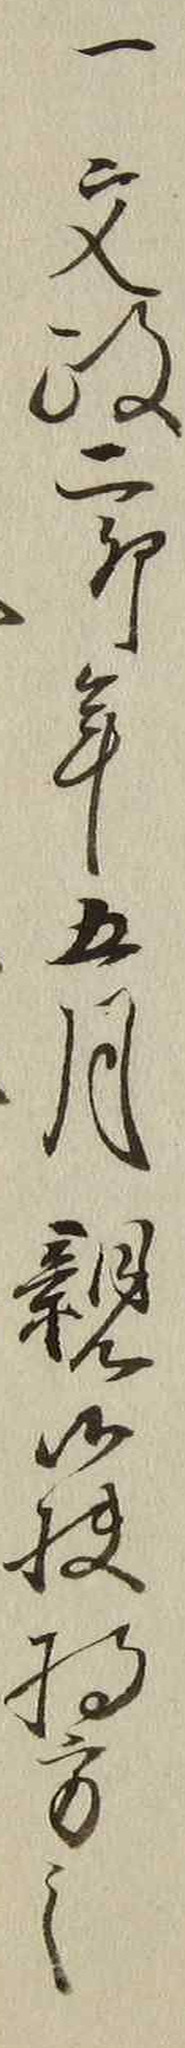一文政二卯年五月親御扶持方之
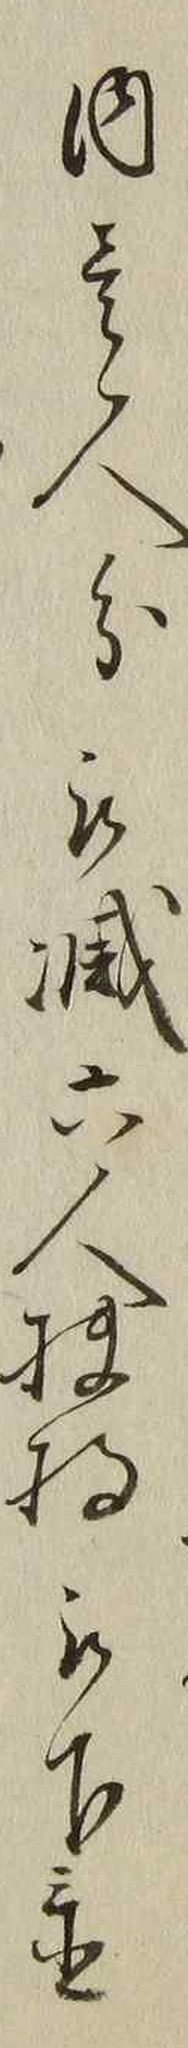内壱人分被減六人扶持被下置
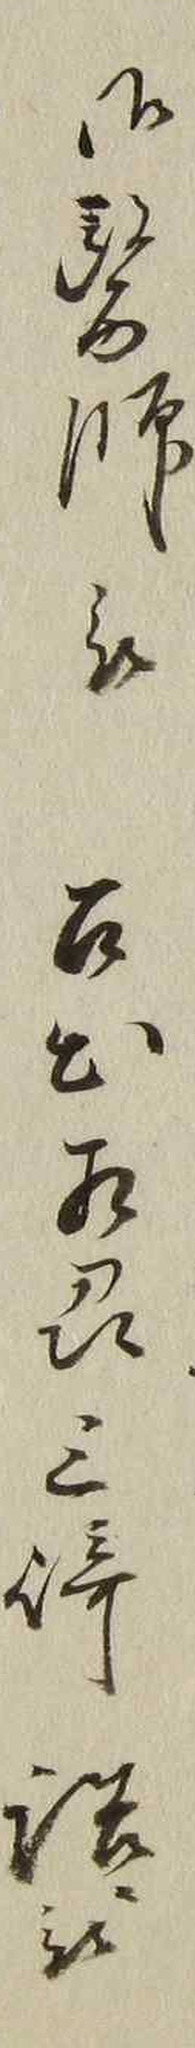御医師被召出相州三崎詰ニ被
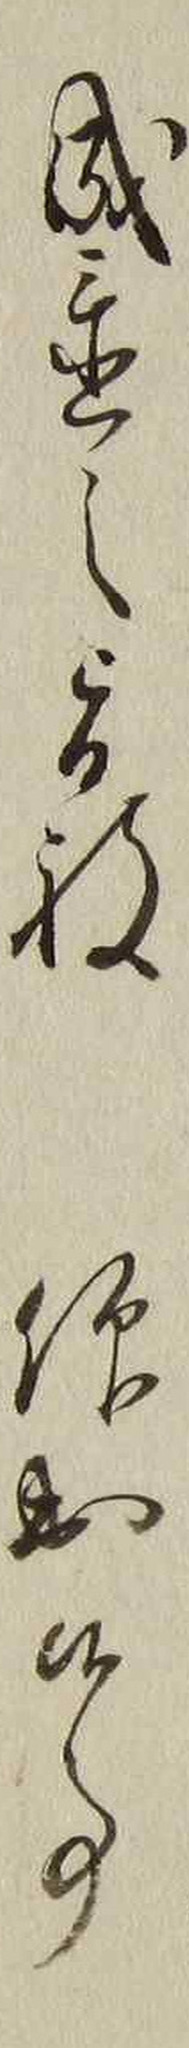成置之旨被仰出候事
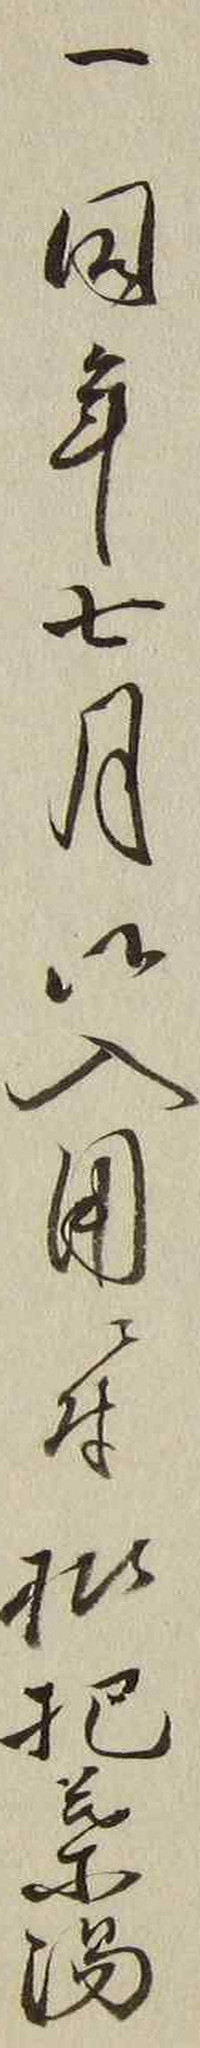一同年七月御入用ニ付枇杷葉場
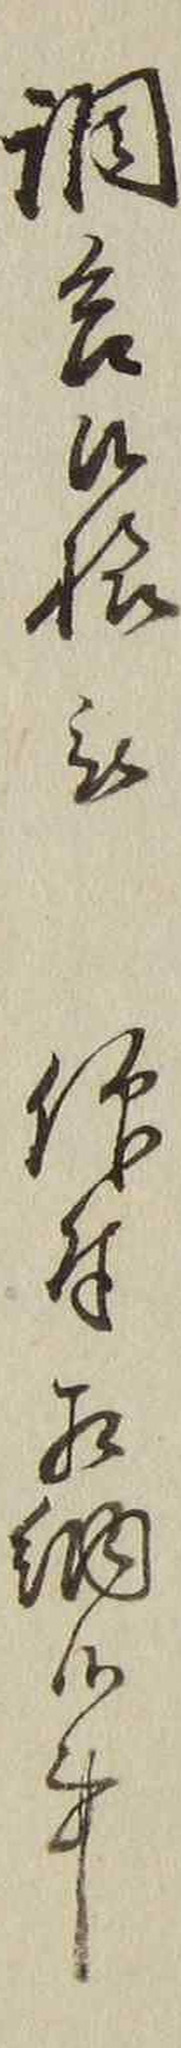調合候様被仰付相納候事
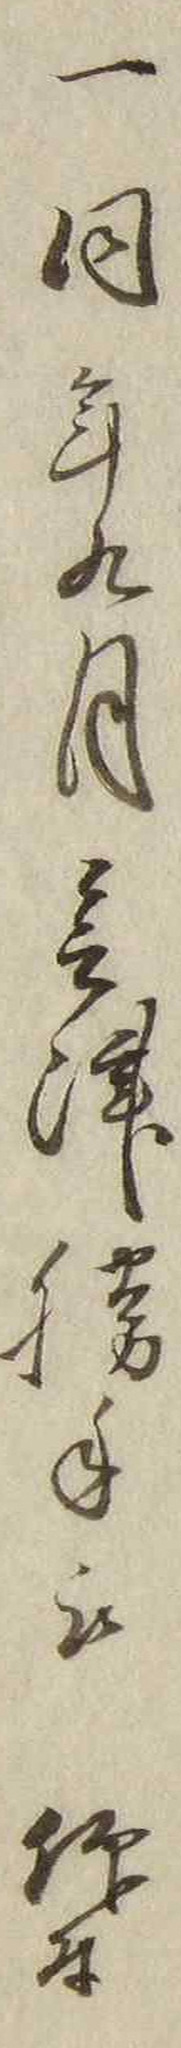一同年九月会津勝手被仰付
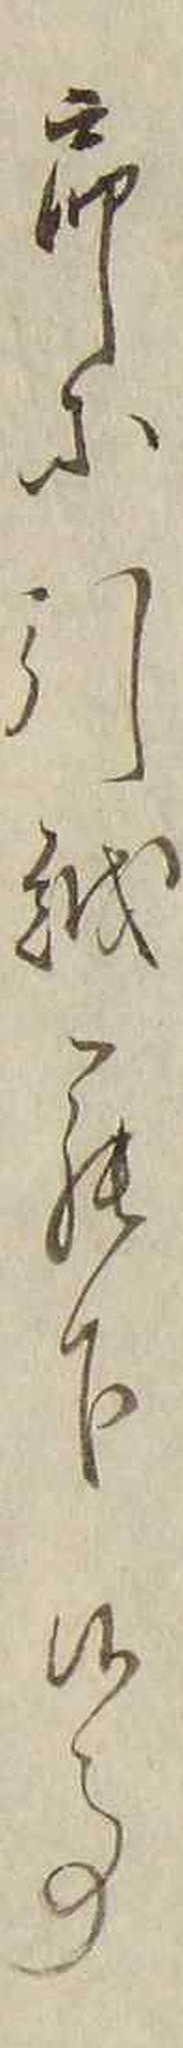郎等引越罷下候事

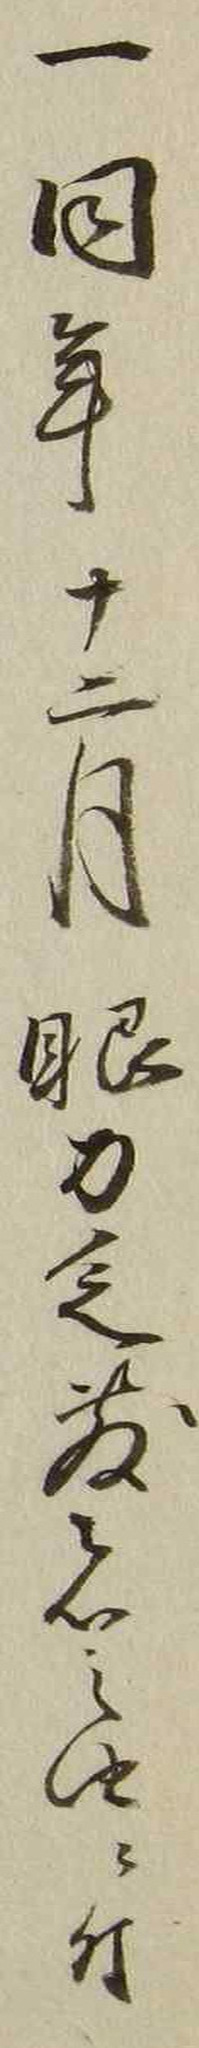一同年十ニ月眼力乏敷者之由ニ付
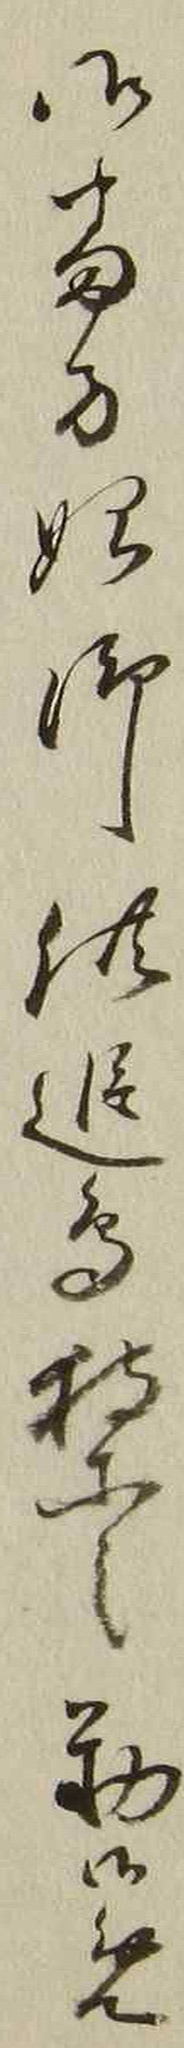御番方始御供追鳥狩等之勤御免
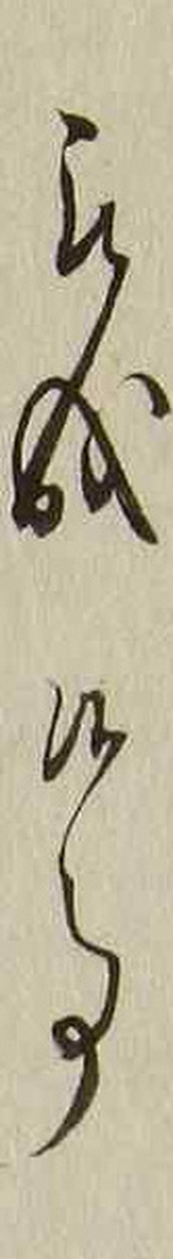被成候事
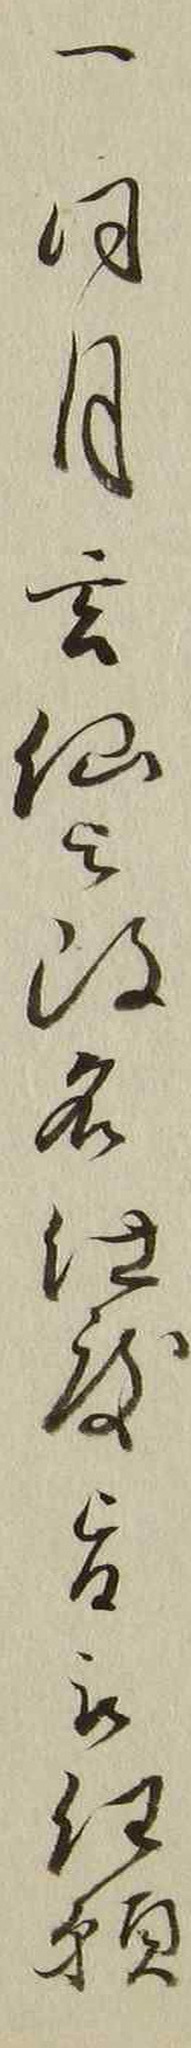一同月玄仙与改名仕度旨被任願
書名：諸士系譜　巻之129　た之部5
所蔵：会津若松市立会津図書館
